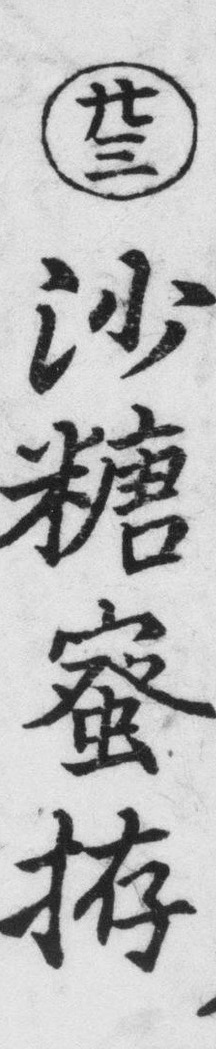(廿三)沙糖蜜拵
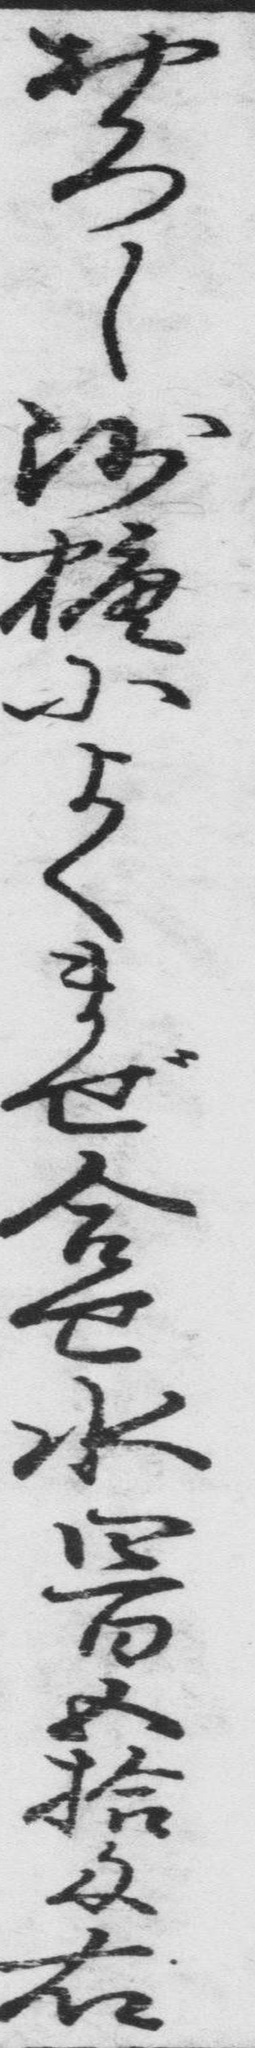おろし沙糖によくまぜ合せ水四百五拾匁右
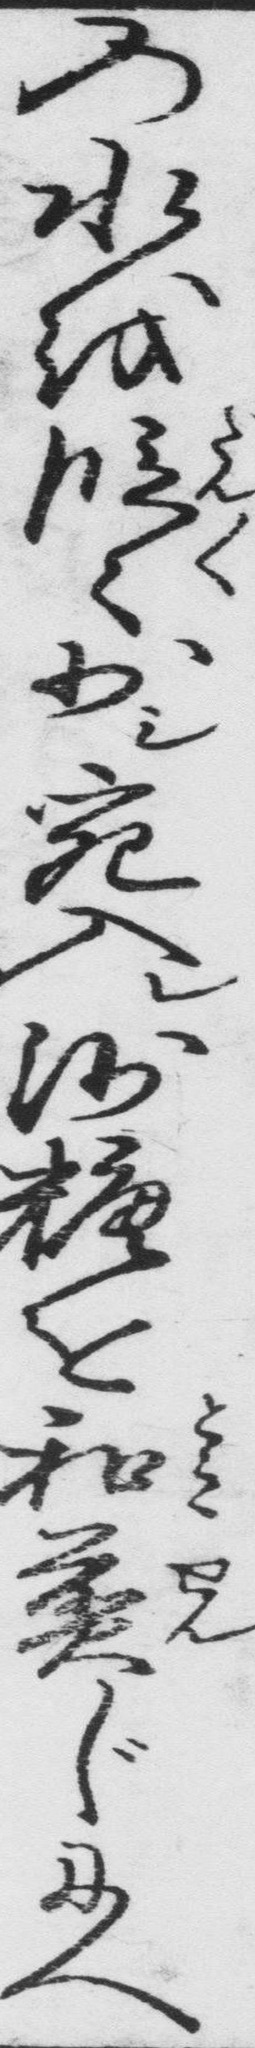の水を段々少し宛入れ沙糖を和煎じにへ
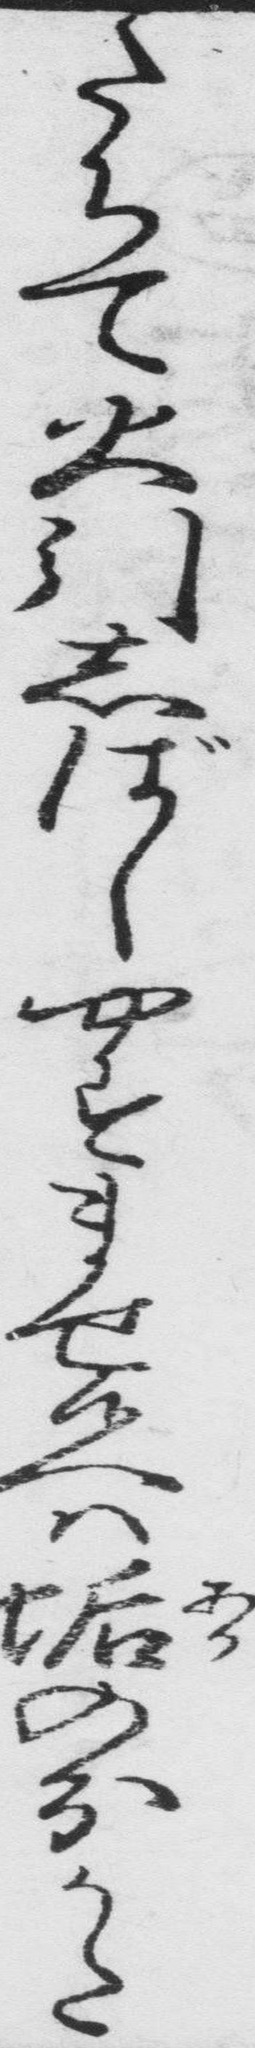たちて火引きしばしやすませ候へは垢の分かた
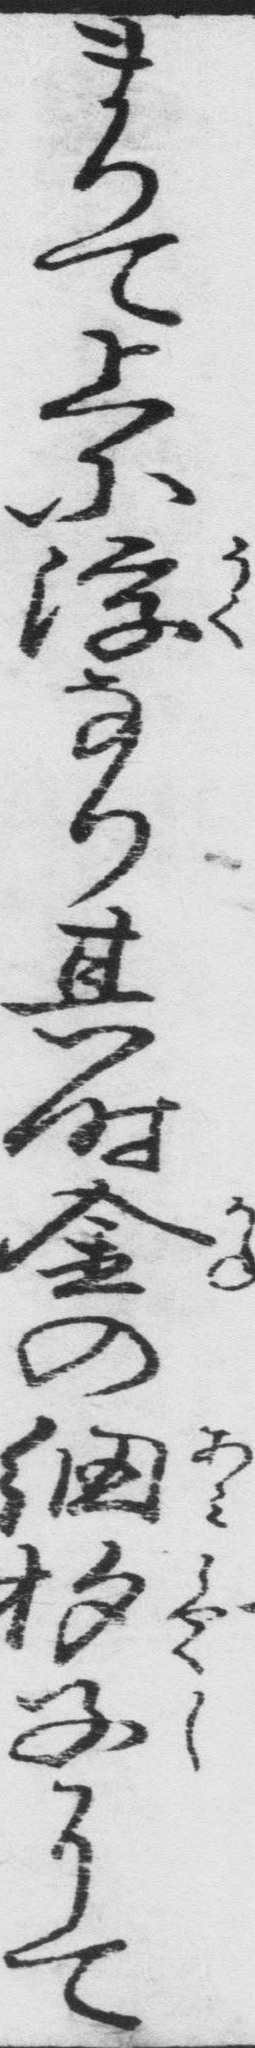まりて上に浮なり其時金の網杓子にて
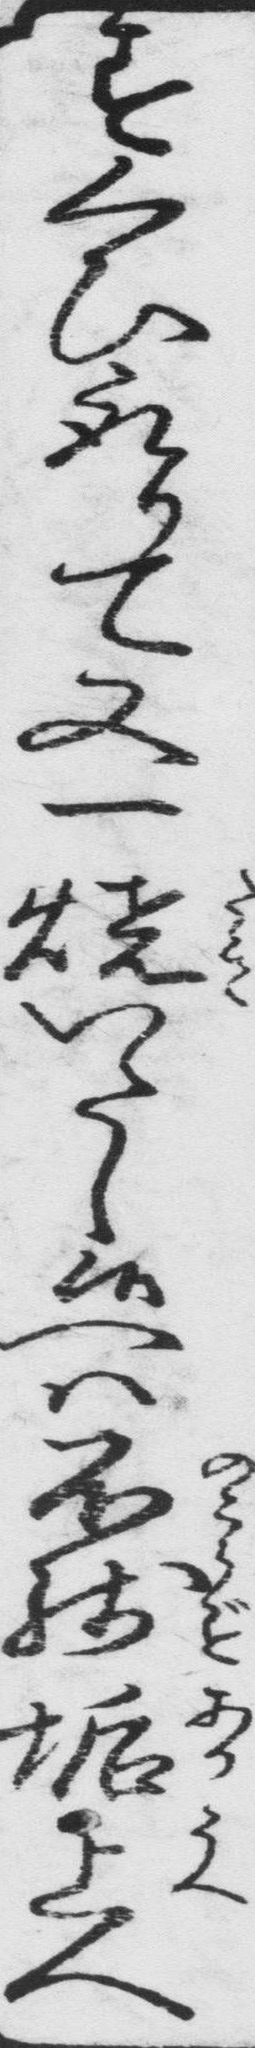すくひ取りて又一焼いたし候へは不残垢上へ

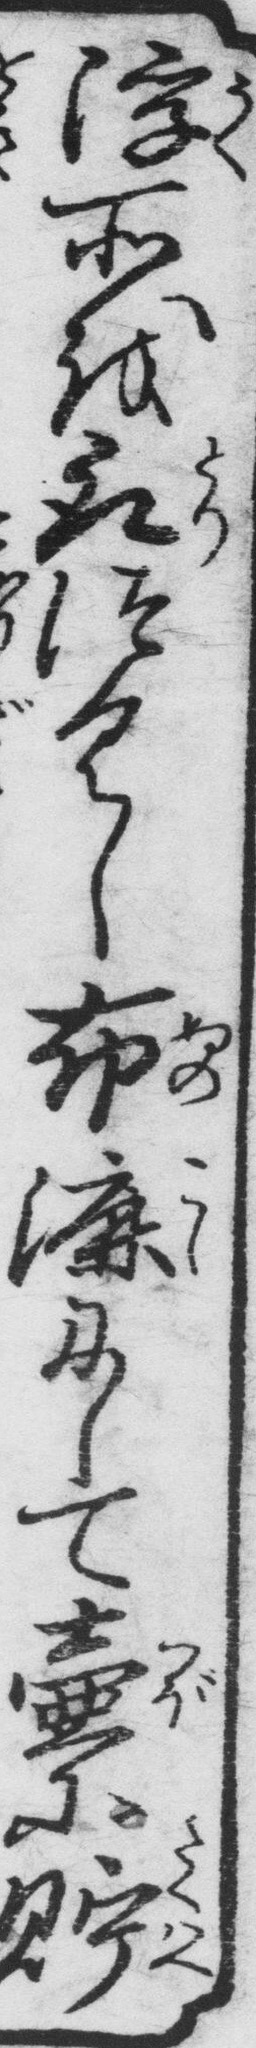浮所を取つくし布漉にして壺に貯
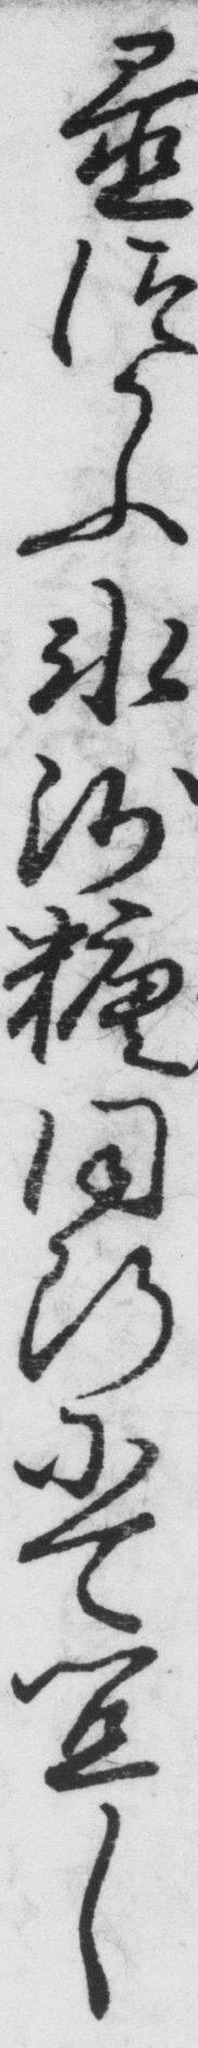置つかふ氷沙糖同断にて宜し
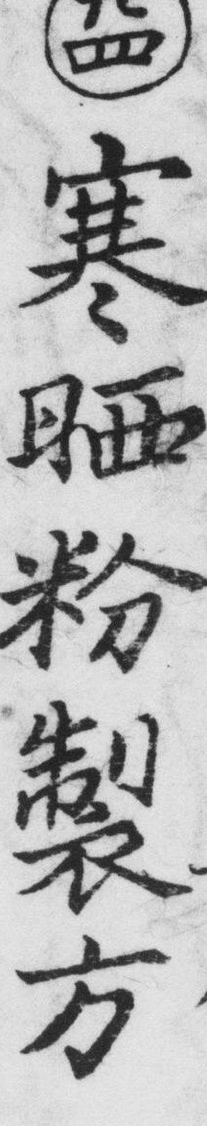(廿四)寒晒粉製方
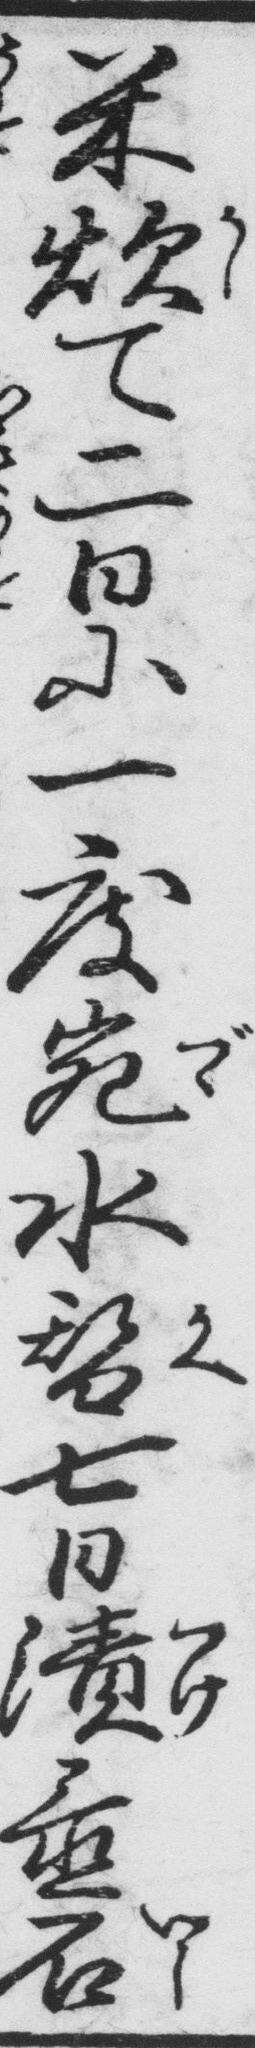米炊て二日に一度宛水替七日漬置石
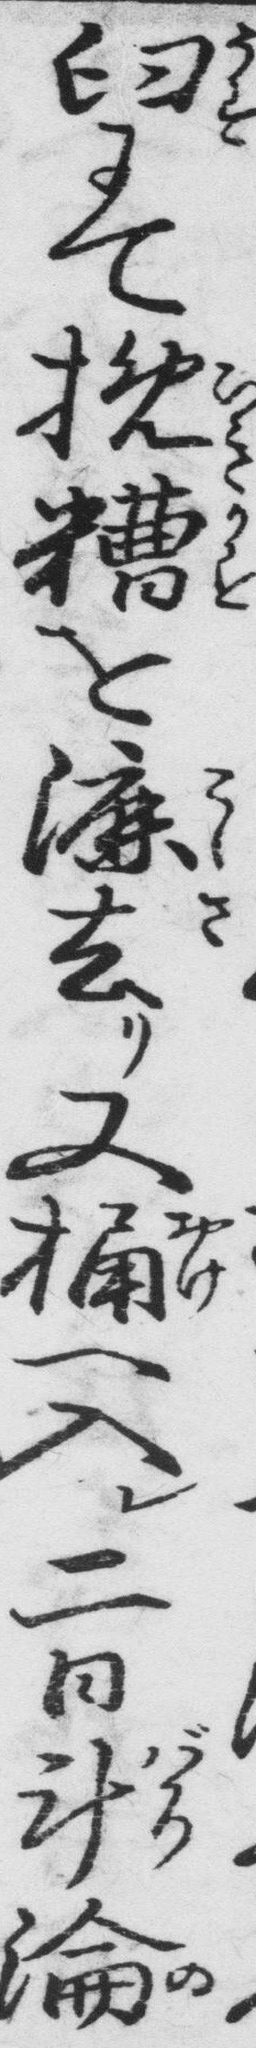臼にて挽糟を漉去り又桶へ入れ二日斗淪
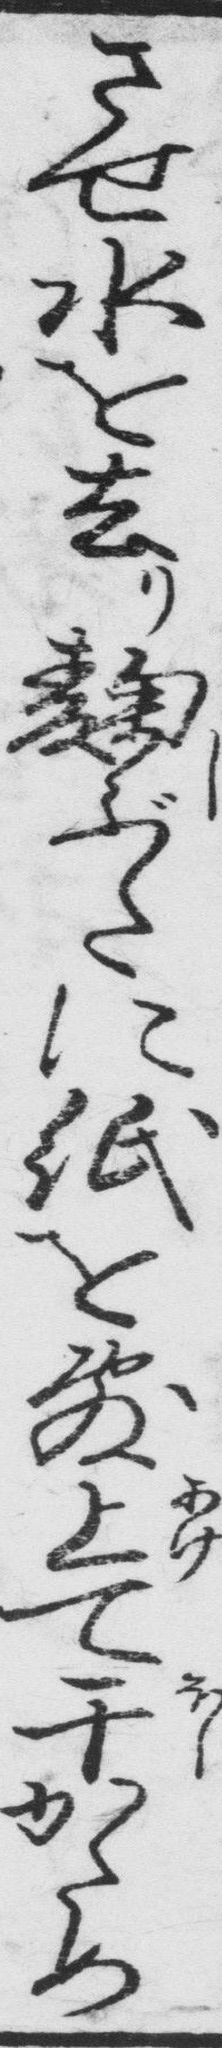させ水を去り麹ぶたに紙を敷上て干かため
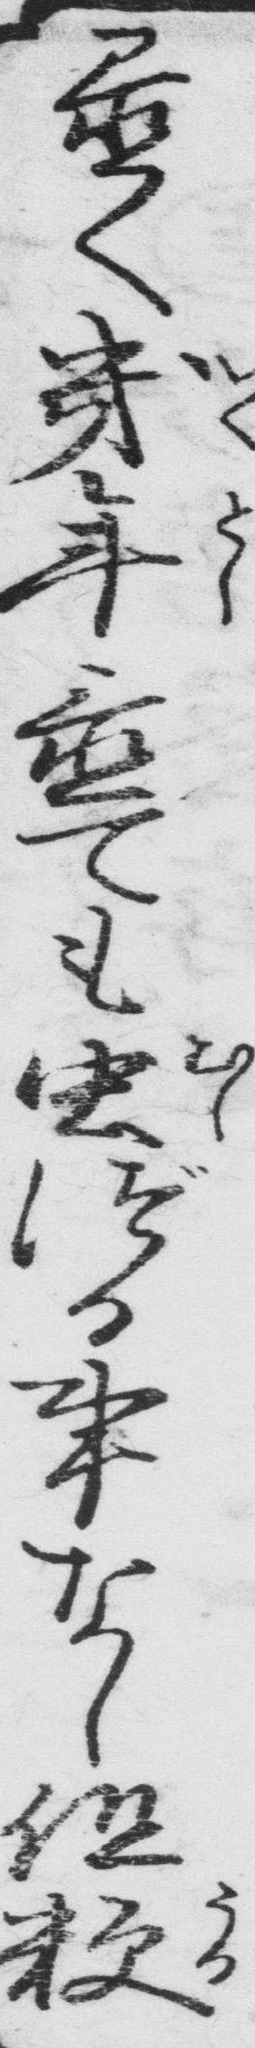置く幾年置ても虫づる事なし但粳
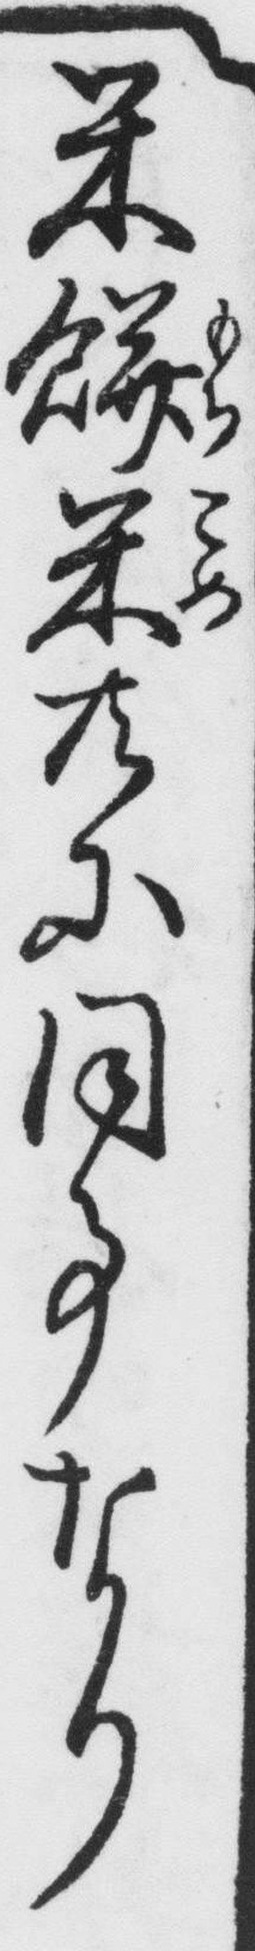米餅米共に同事なり
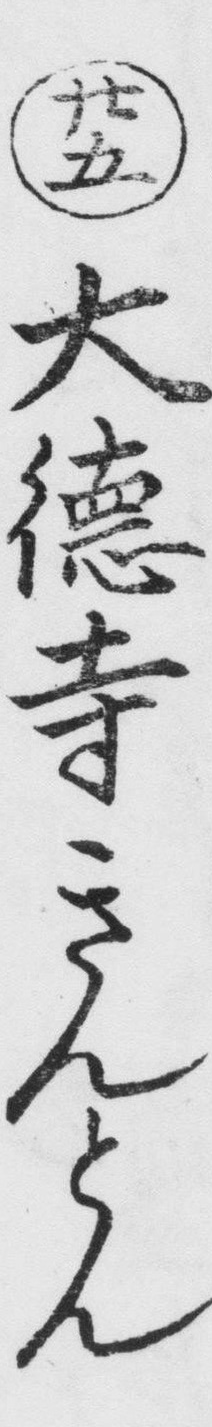(廿五)大徳寺きんとん
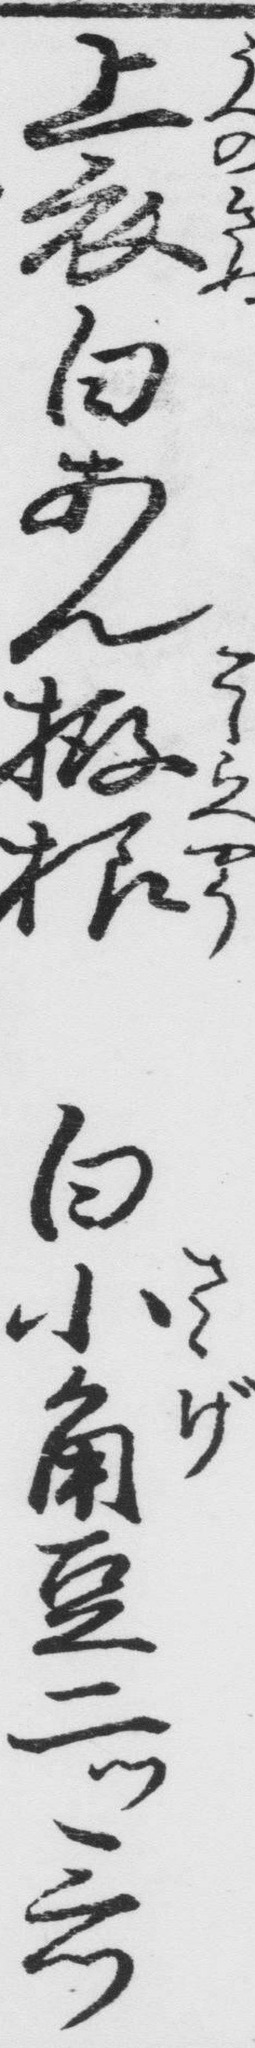上衣白あん拵様白小角豆二ツ三ツ
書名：御前菓子図式
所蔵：大阪府立大学学術情報センター 国文学研究資料館
